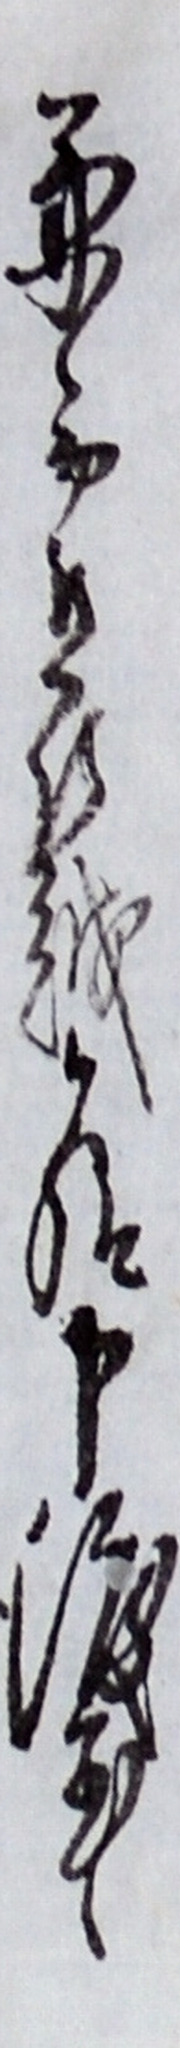兼て被罷越候様申渡置候

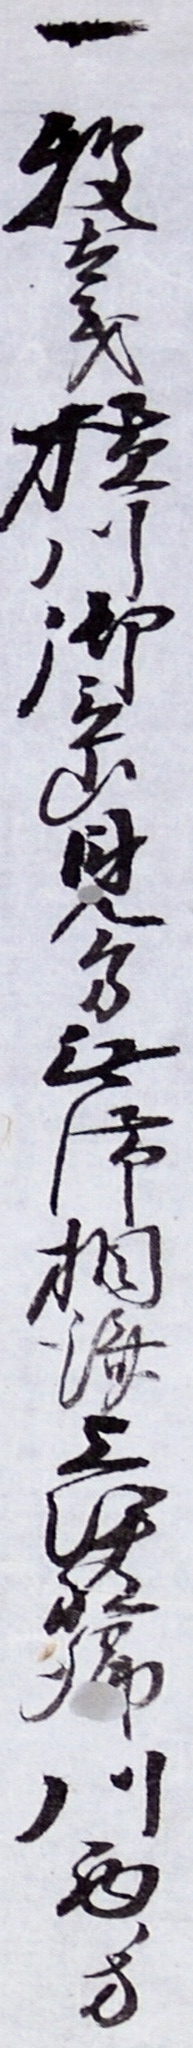一牧太義横川御立山見分無滞相済上伊那郷川西ノ方
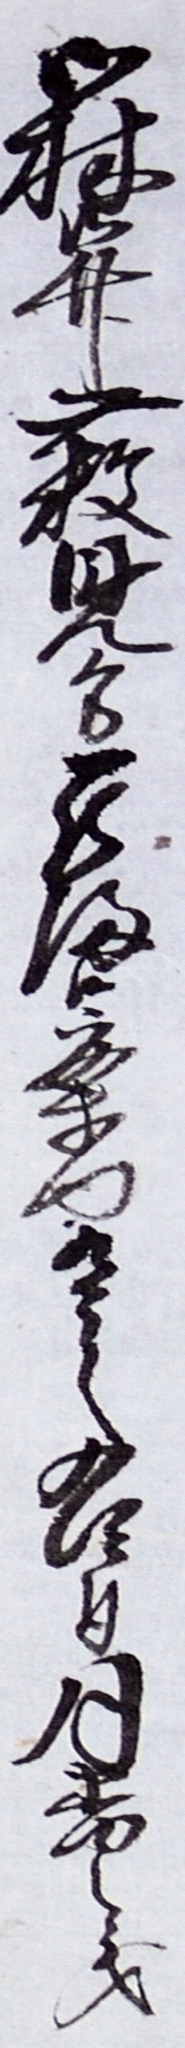御林御竹薮見分罷帰候案内有之右ニ付月番之義
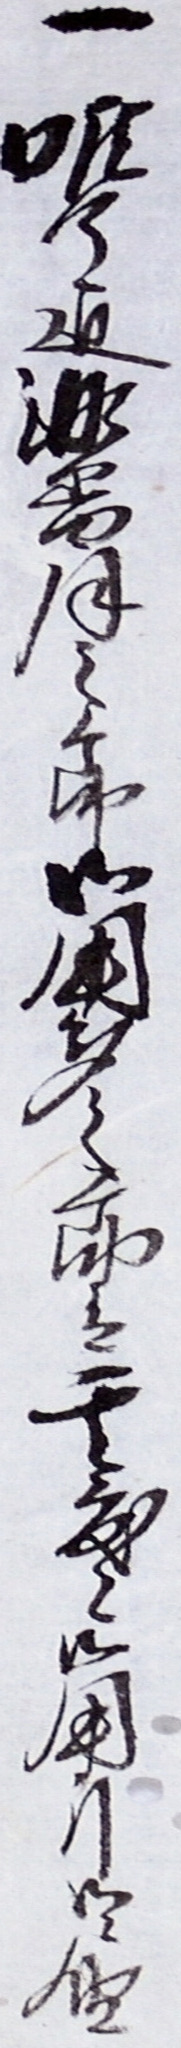一唯今迄非番月之節御用多之筋は其度々御用引御届
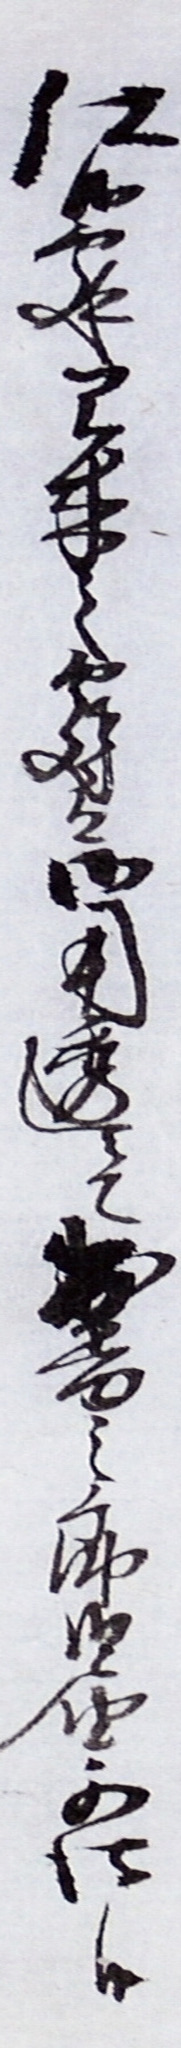仕候処已来之処は御用透ニて出番之節御届御届可仕候
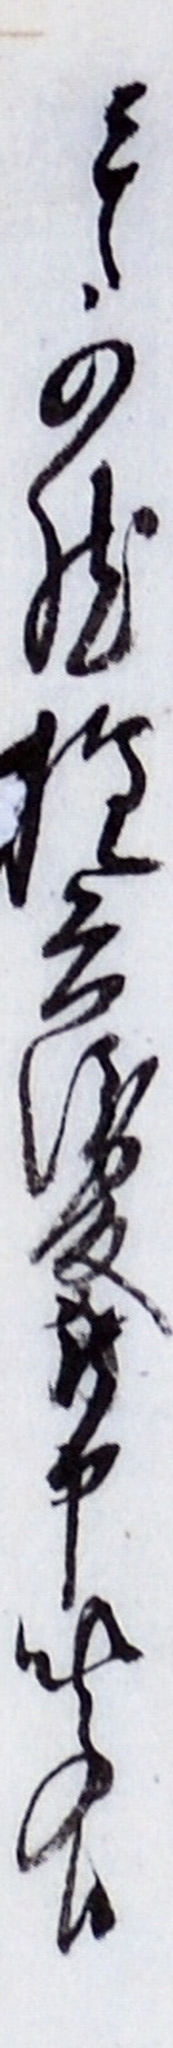ニて可然権兵衛殿被申聞候
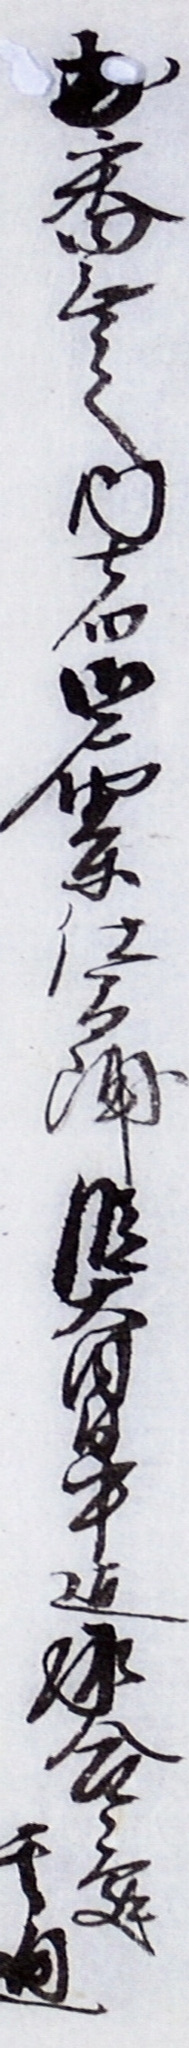出番無之内は御届等仕間鋪段大目付中迄承合之処
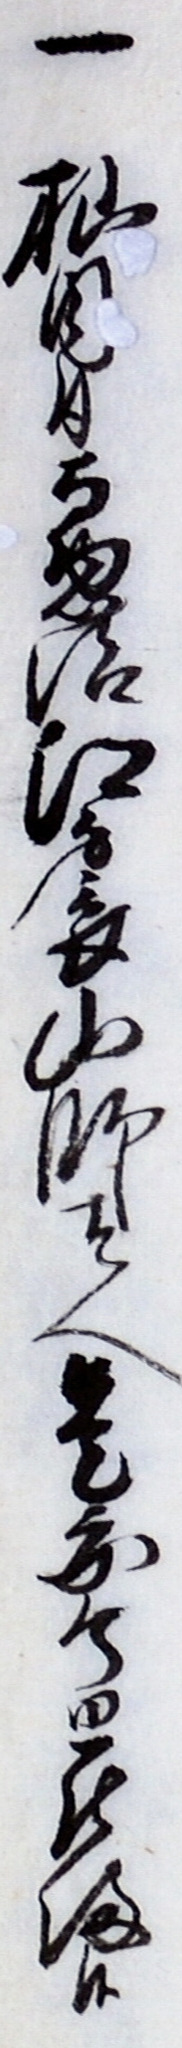一杣目付与惣治江戸表山師壱人是亦今日罷帰候
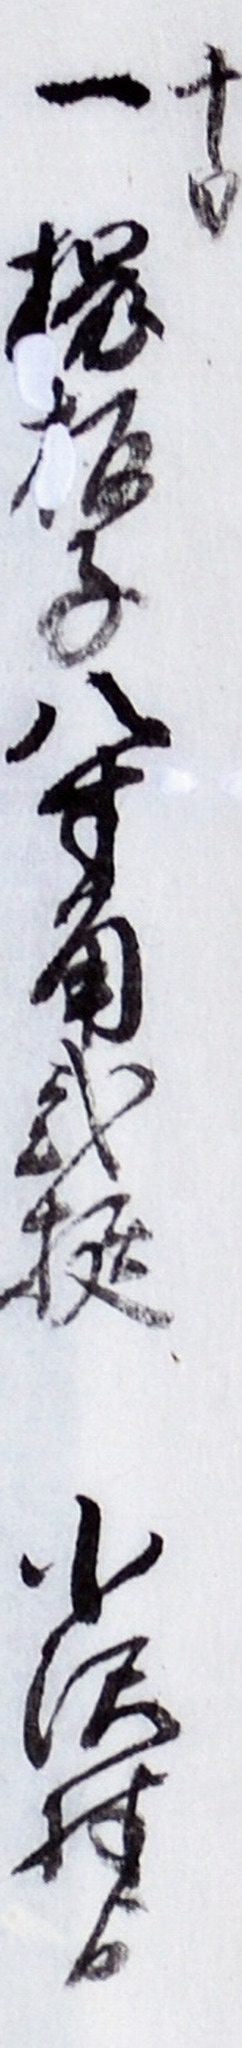一椹板子八寸角弐挺小沢村より
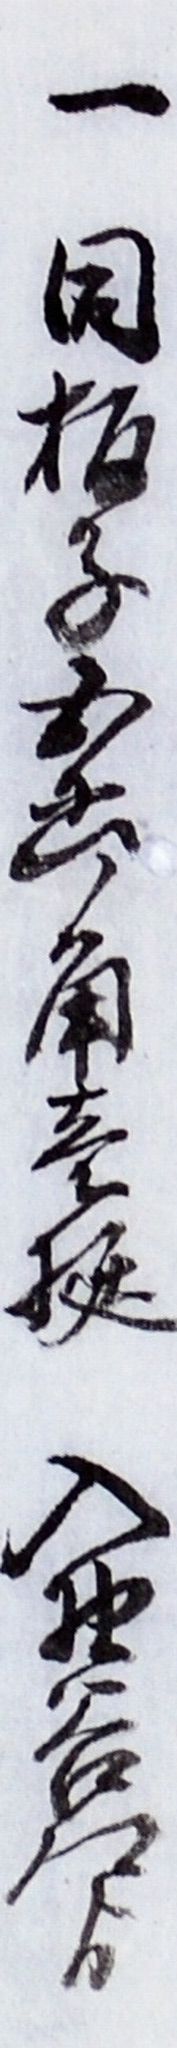一同板子五六ノ角壱挺入野谷郷より
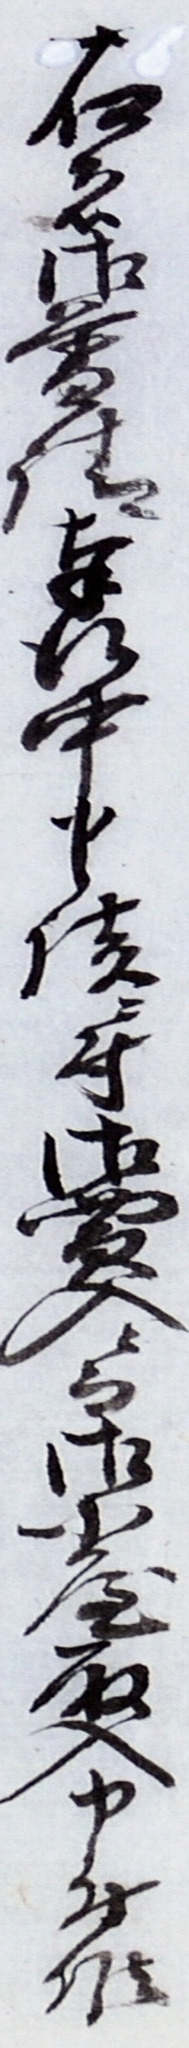右は御普請奉行中申談ニ付御買入ニ而御小屋取入申付候
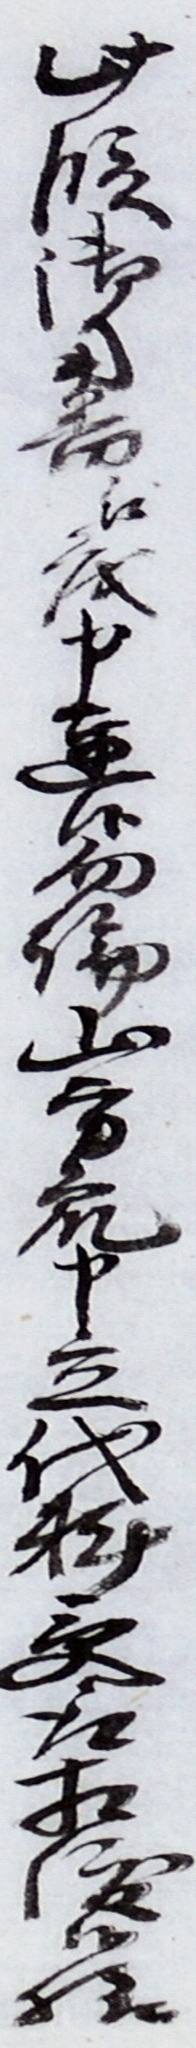此段御用番江も申達候勿論山方衆申立代料受取相渡候様
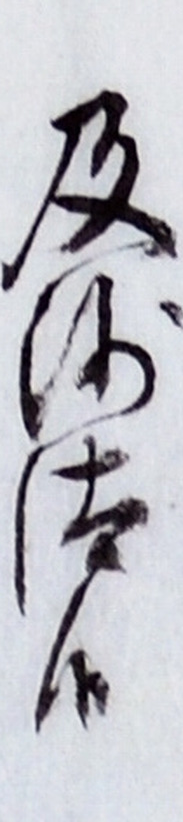及沙汰候
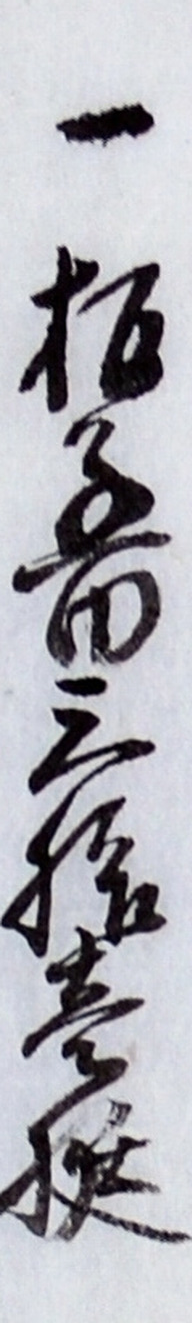一板子百三拾壱挺
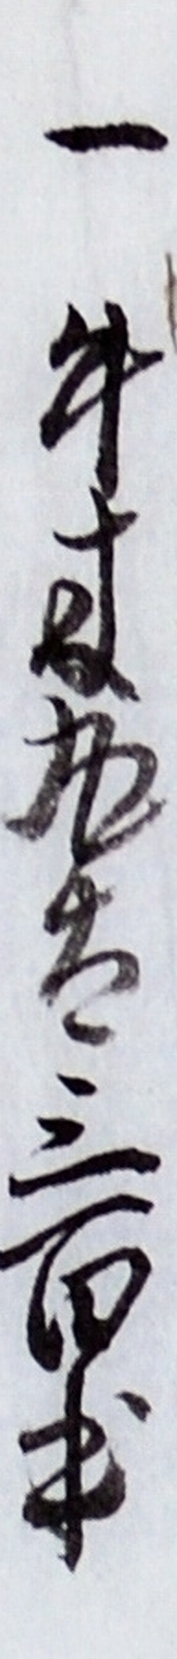一牛木丸太三百本
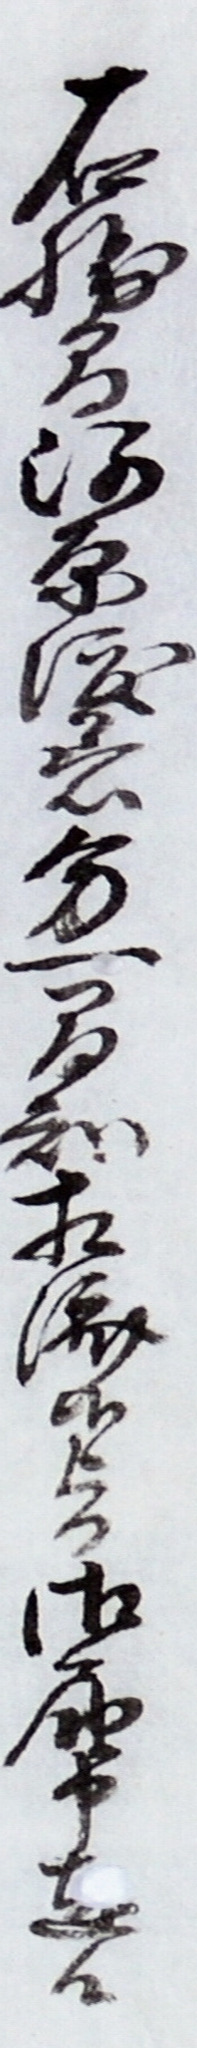右勝間河原渡着分一間知相済候旨御届申達候
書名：御山奉行御用控
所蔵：伊那市立高遠町図書館・合同会社AMANE
